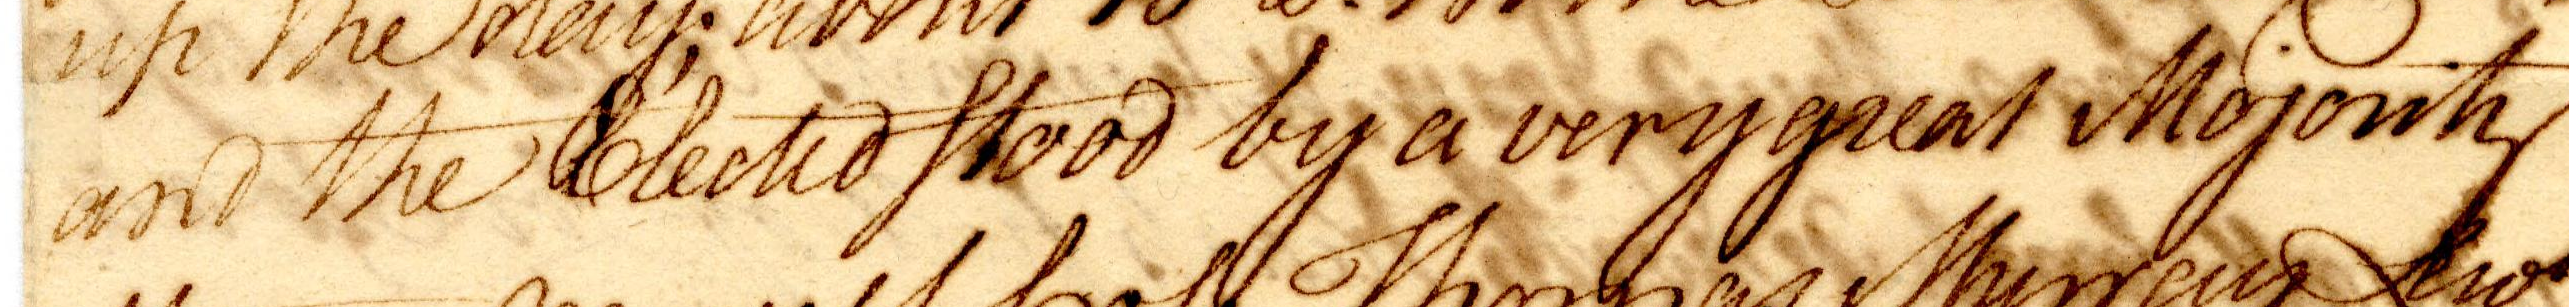and the Elected Stood by a very great Majority
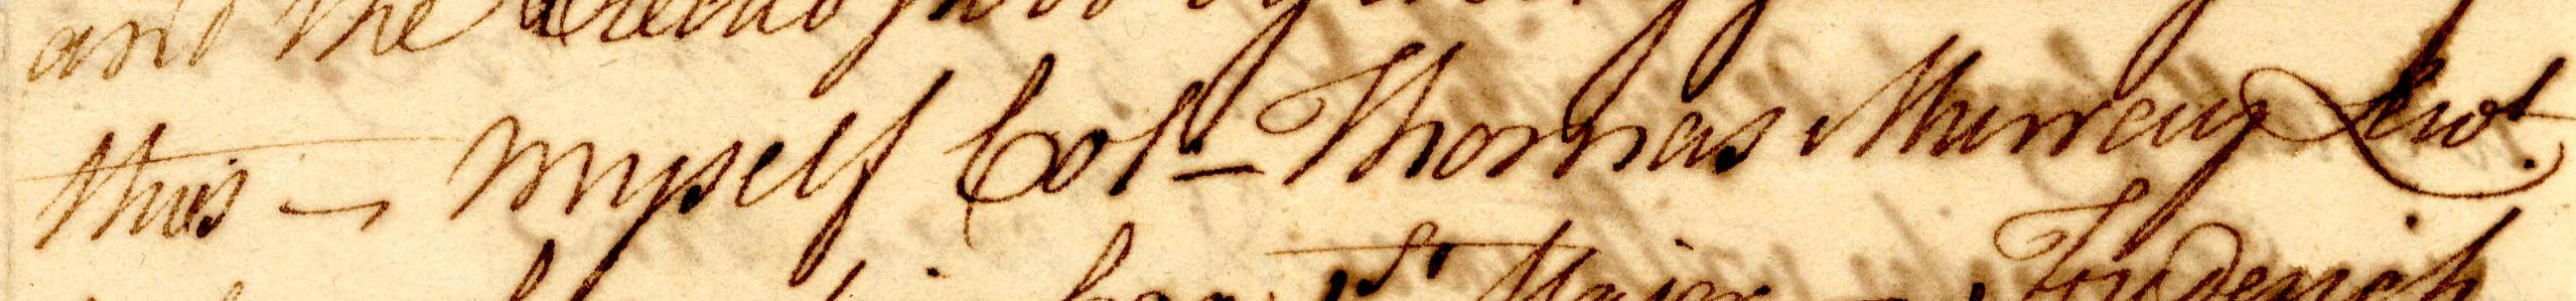thus- myself Col. Thomas Murray Leu^t.
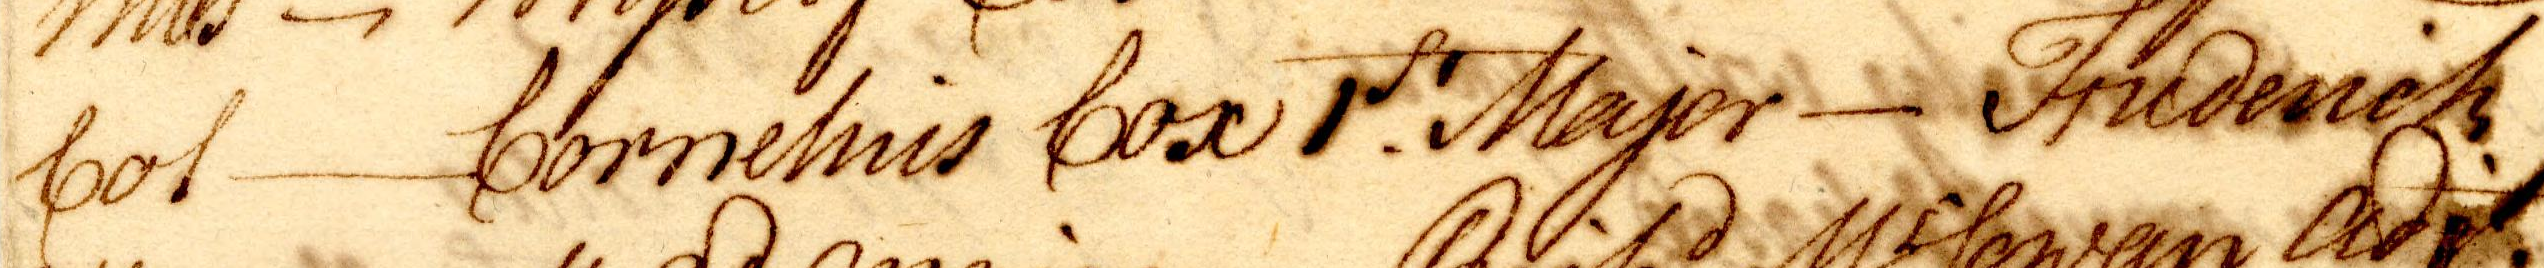Col. Cornelius Cox 1^st. Major. Frederick
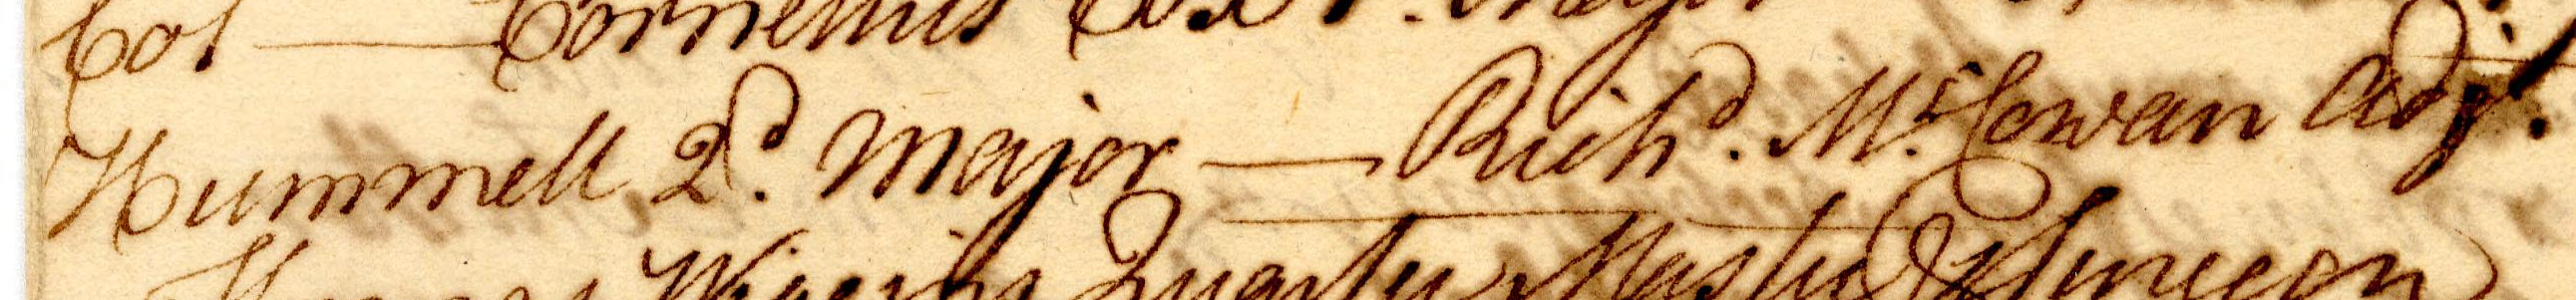Hummell 2^d. Major. Rich^d. M^cCowan Adj^t.
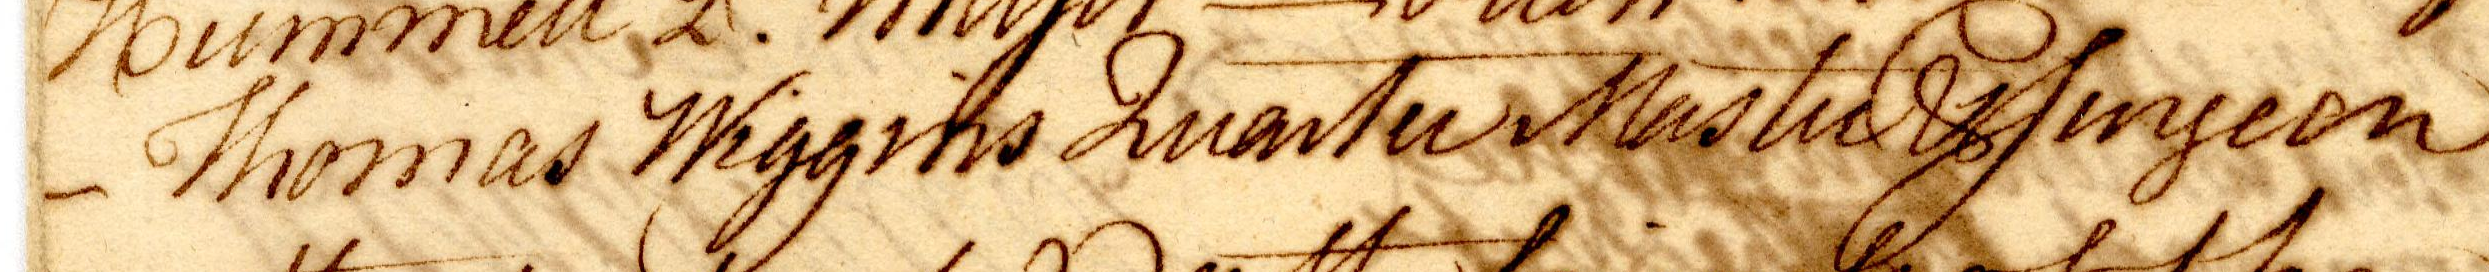Thomas Wiggins Quarter Master & Surgeon
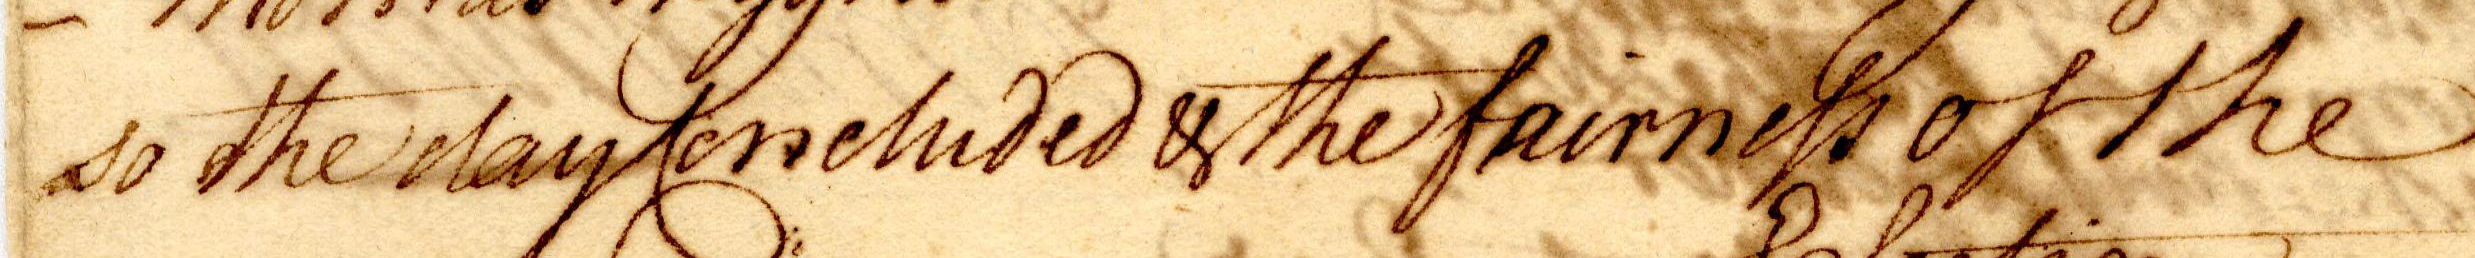so the day concluded & the fairness of the
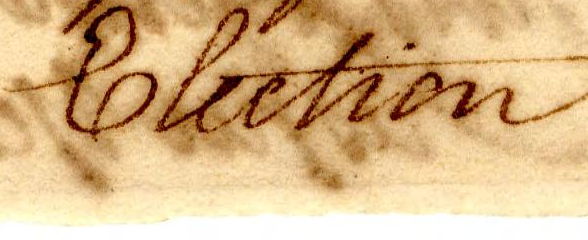Election
